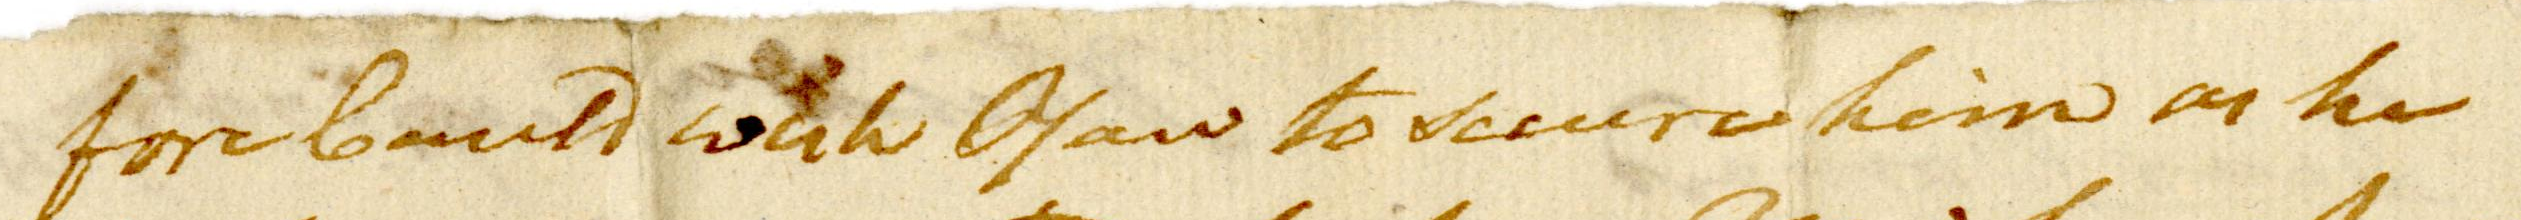fore Could wish you to secure him as he
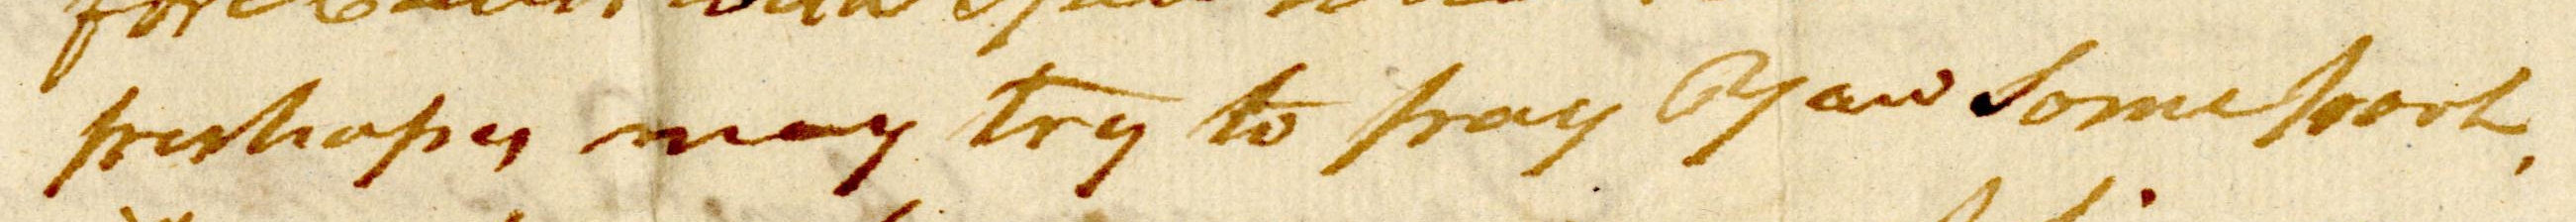perhaps may try to pay you Some part
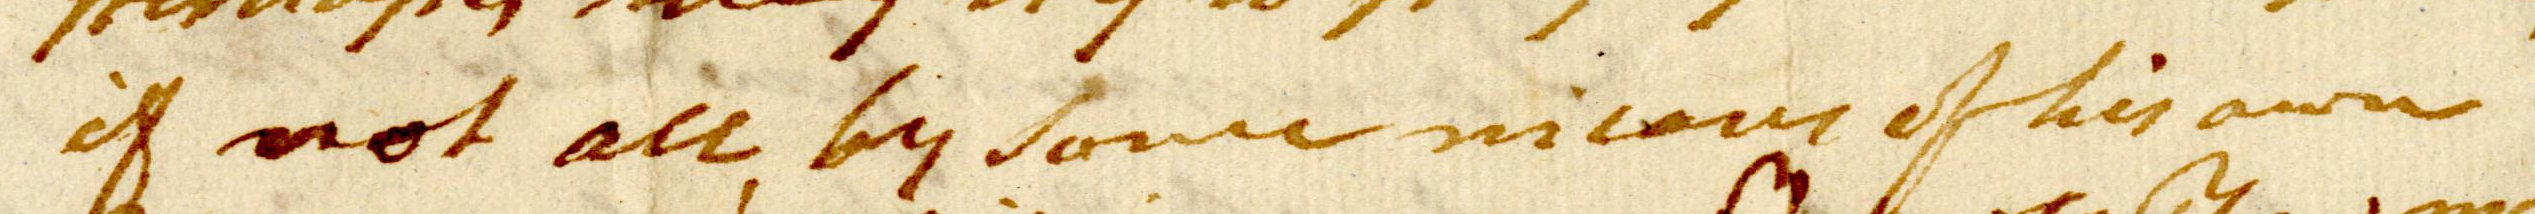if not all by Some risons of his own
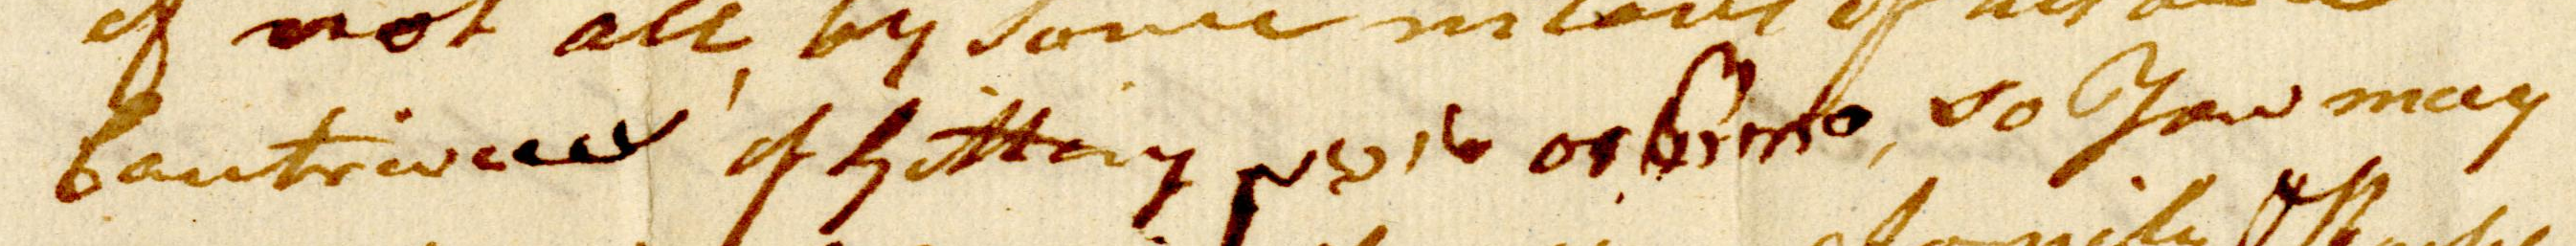Cautionally of Getting [_____] [____] so you may
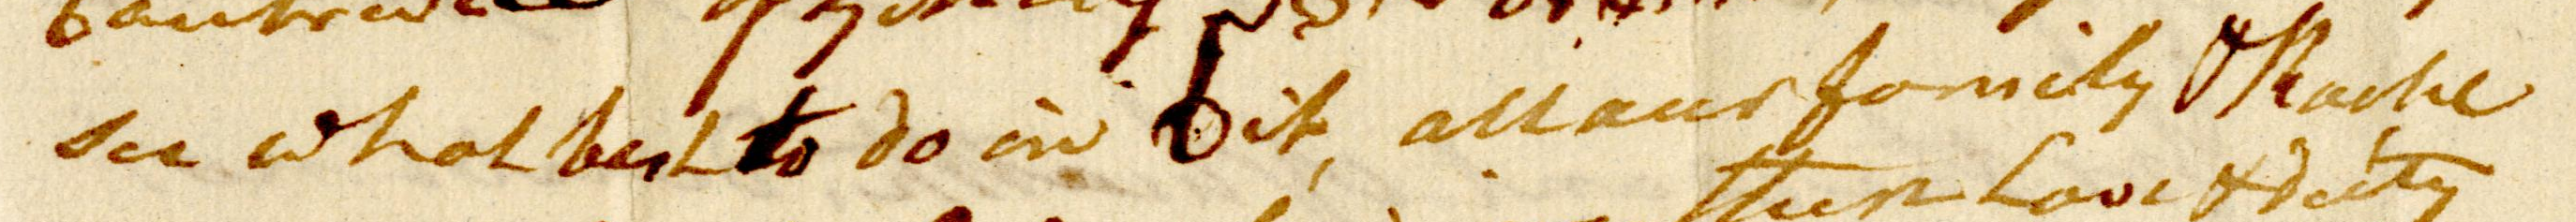see what but to do in it, all our family & Rachel
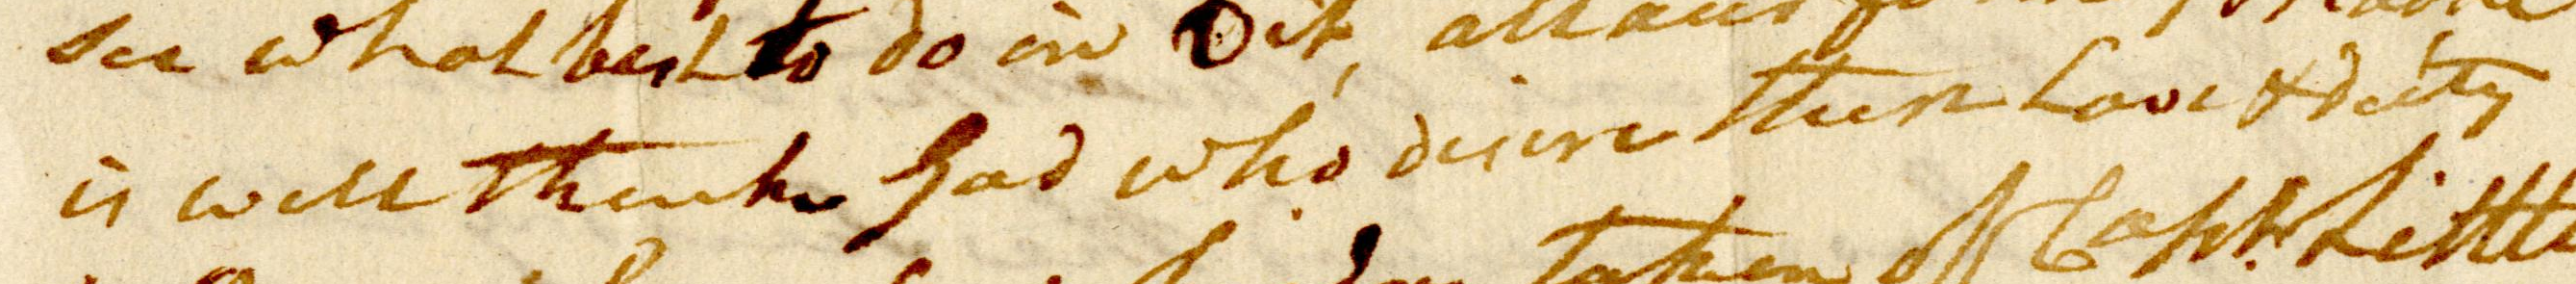is well thank God who desire ther love & duty
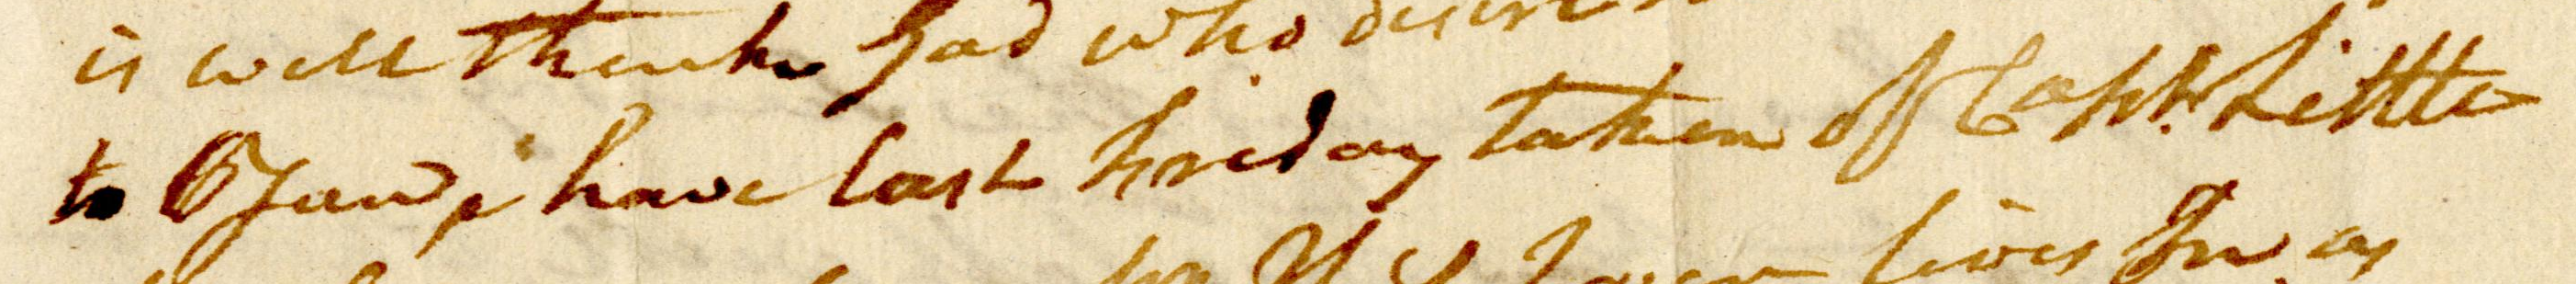to you have last friday taken of Cap^t. Little
